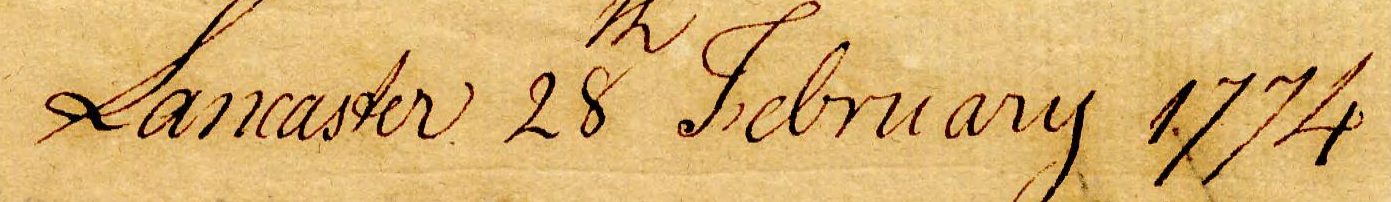Lancaster 28^th February 1774
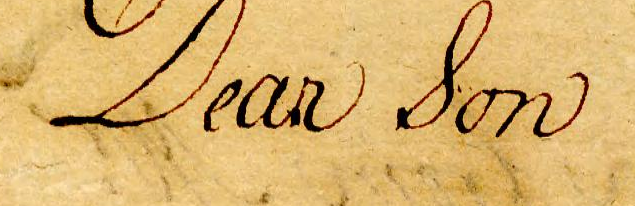Dear Son
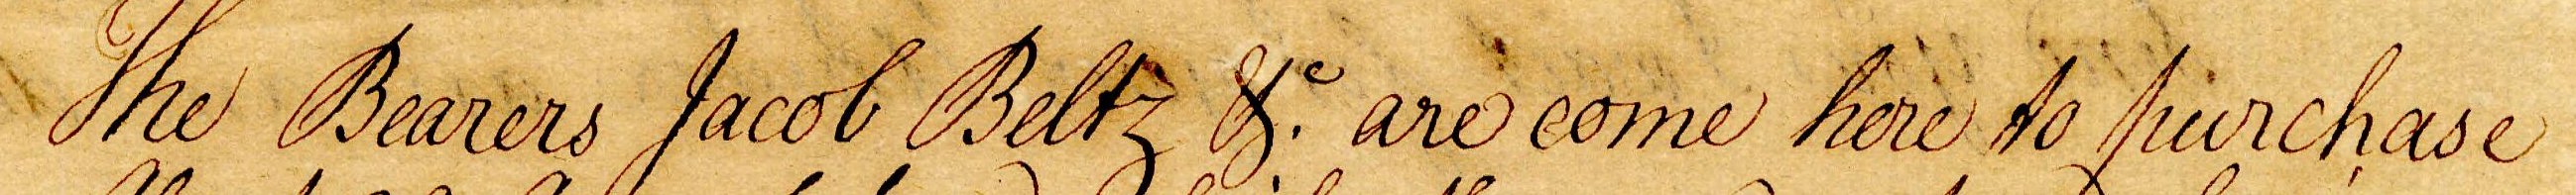The Bearers Jacob Beltz &^c. are come here to purchase
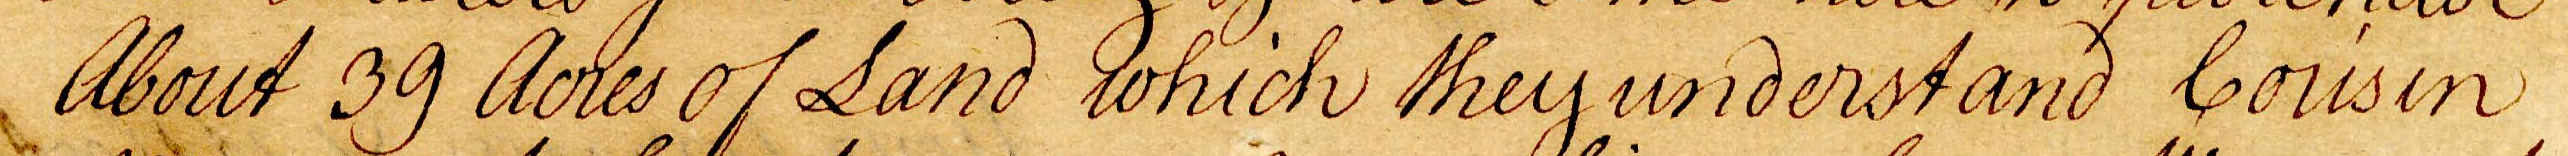About 39 Acres of Land which they understand Cousin
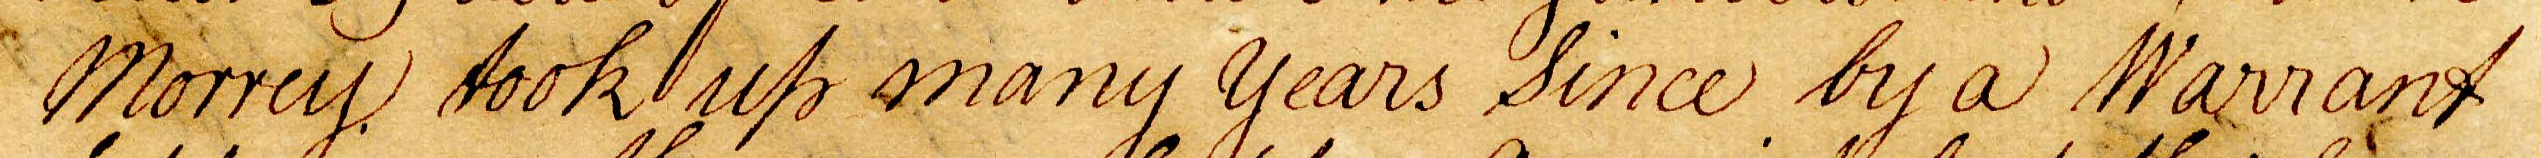Morrey took up many Years since by a Warrant
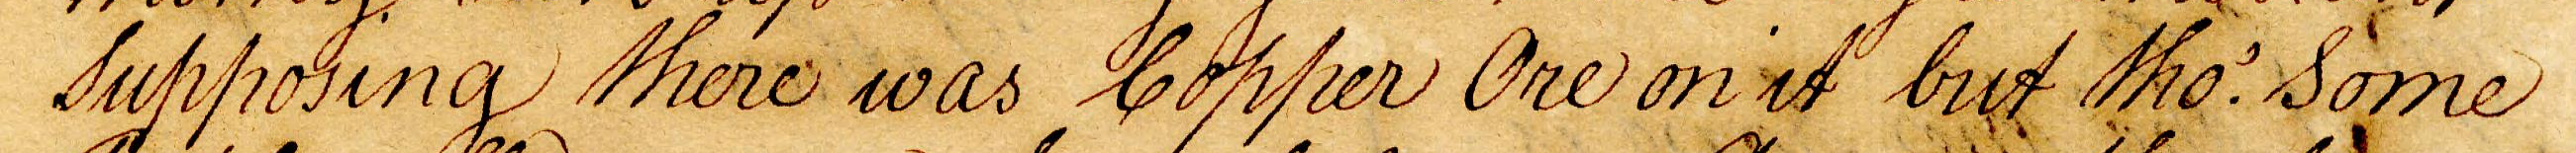Supposing there was Copper Ore on it but tho^s. some
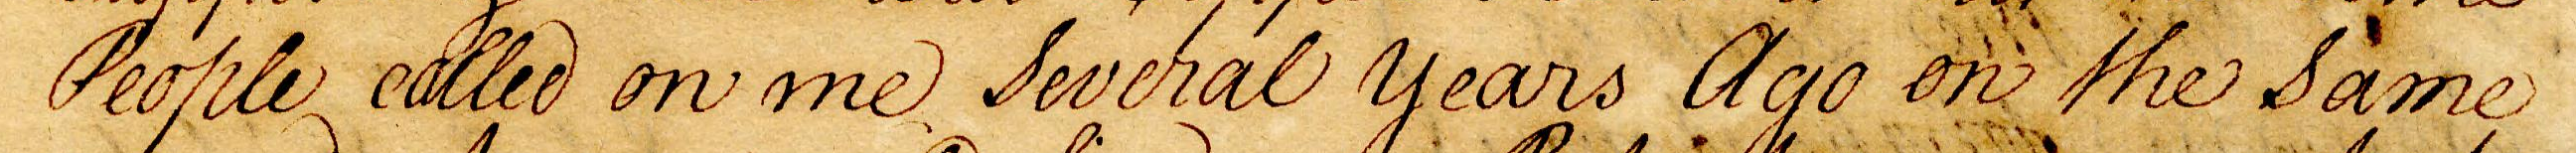People called on me several years Ago on the same
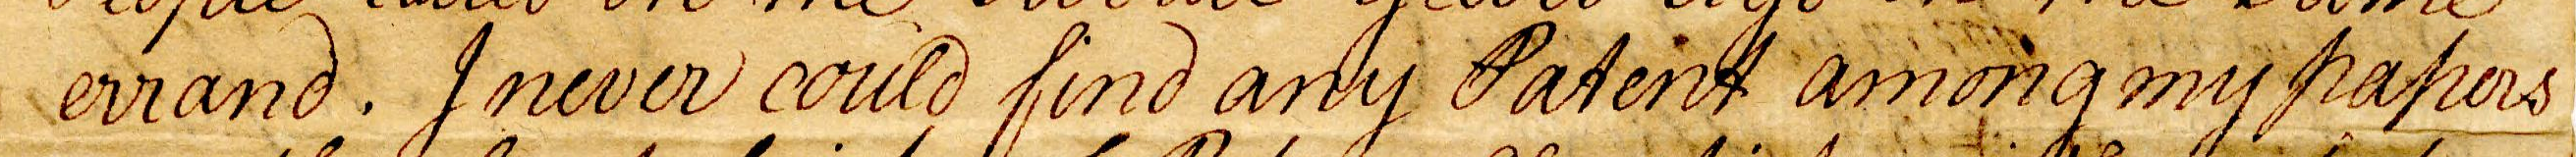errand. I never could find any Patent among my papers
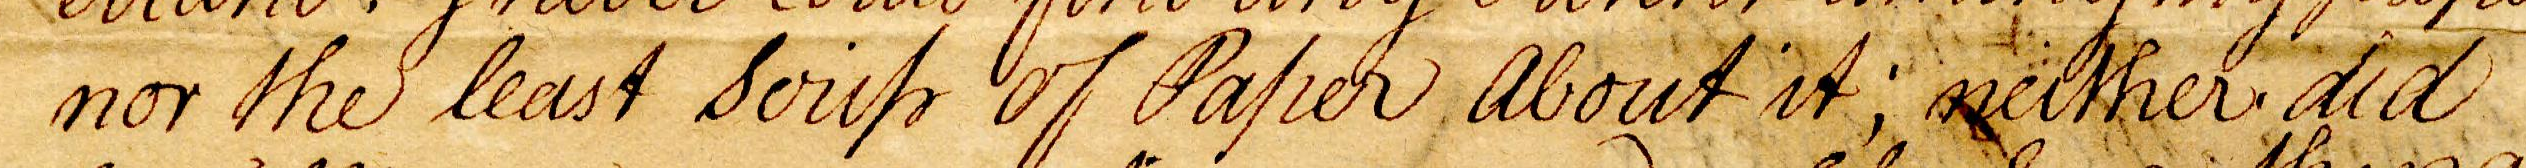nor the least scrip of Paper About it; neither did
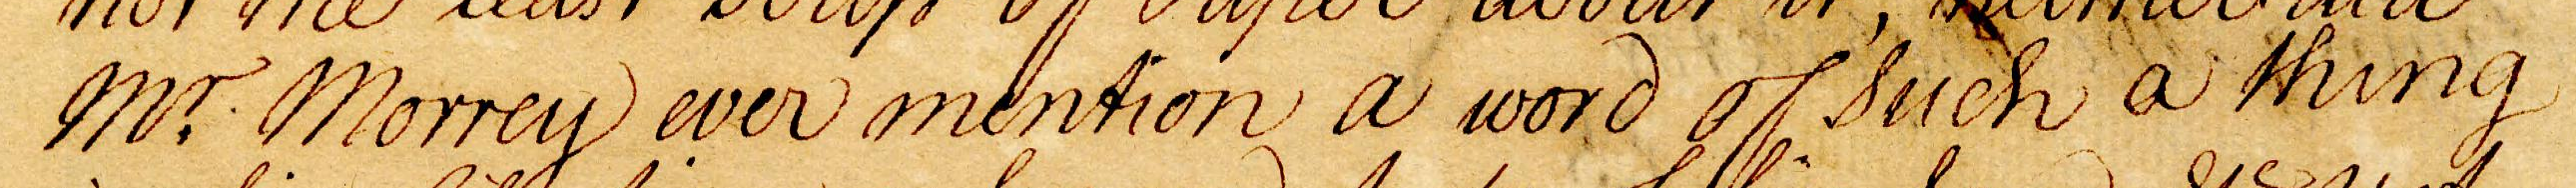M^r. Morrey ever mention a word of such a thing
